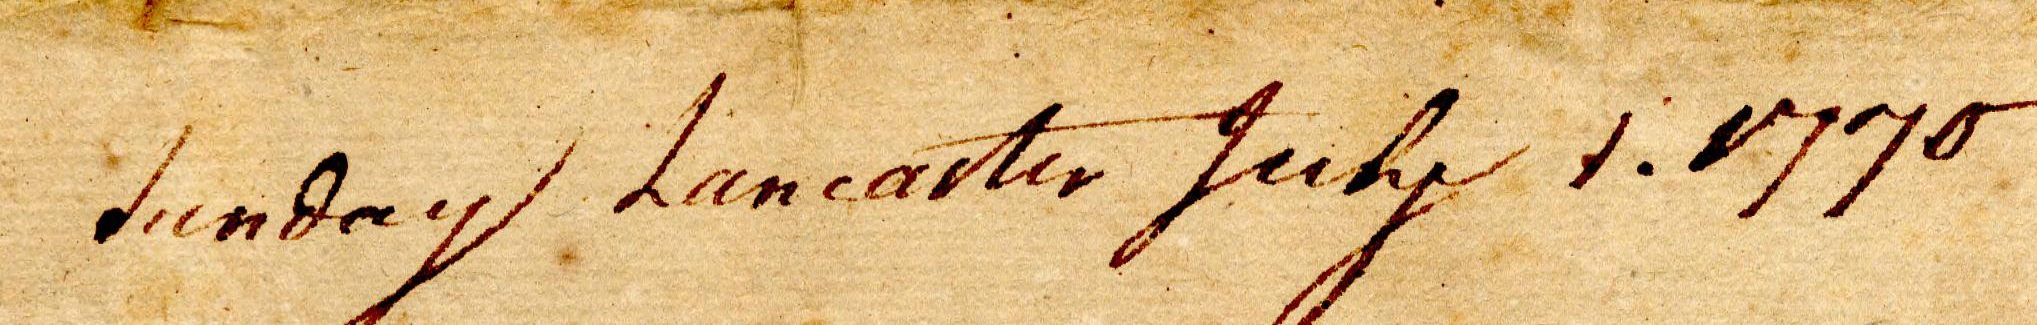Sunday Lancaster July 1st. 1770
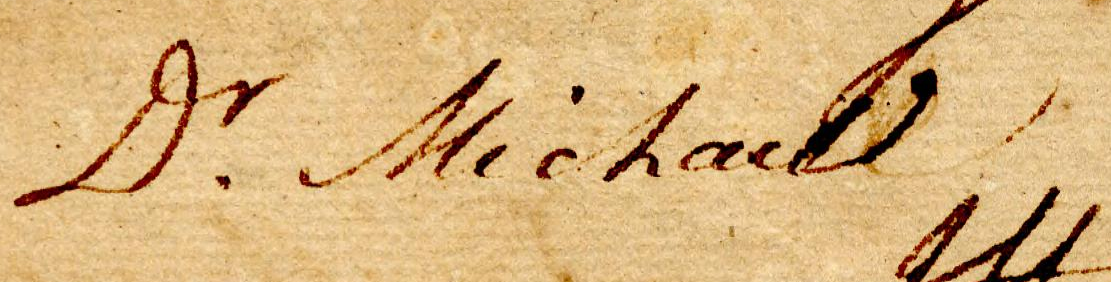D^r. Michael
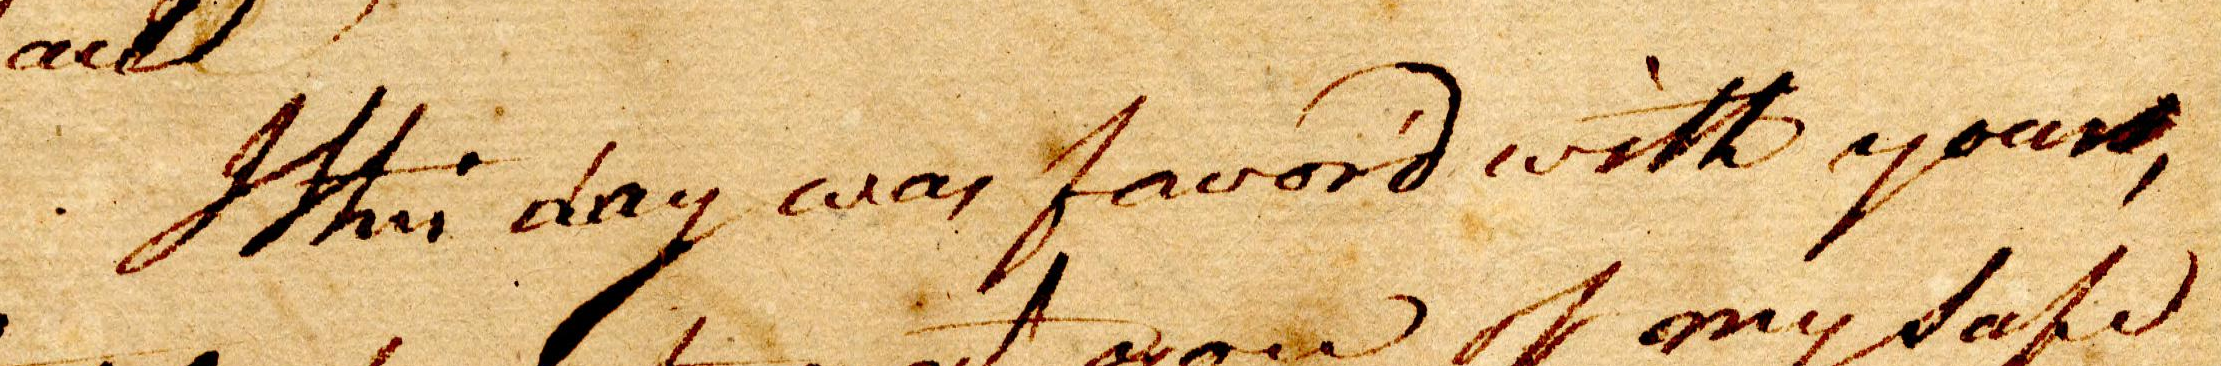I this day was favor'd with your,
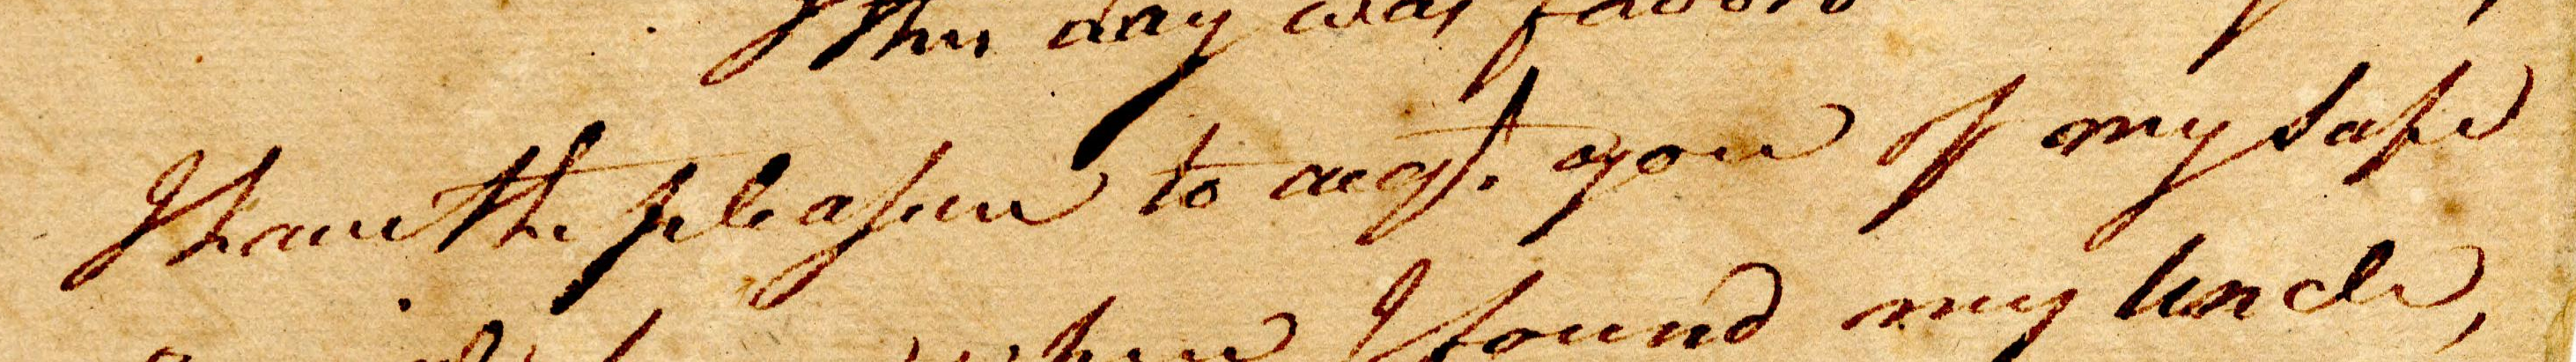I have the pleasure to acq^t. you of my safe
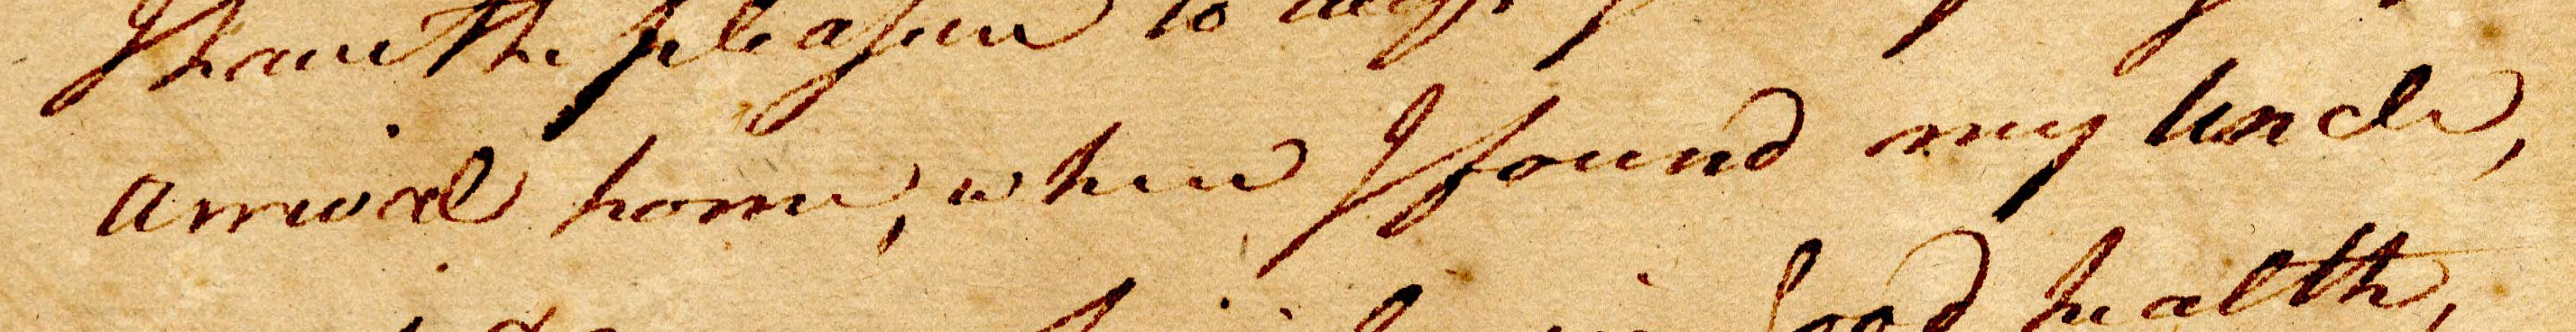arrival home, where I found my Uncle
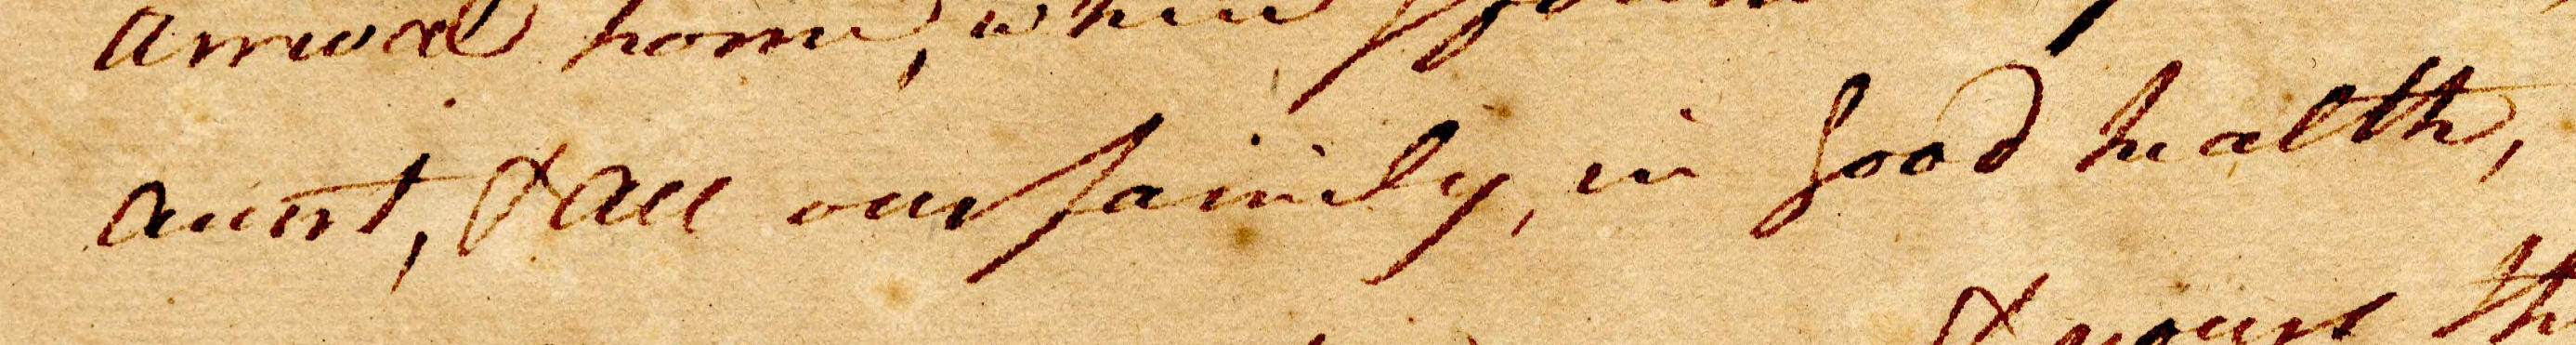aunt, & All our family, in good health,
